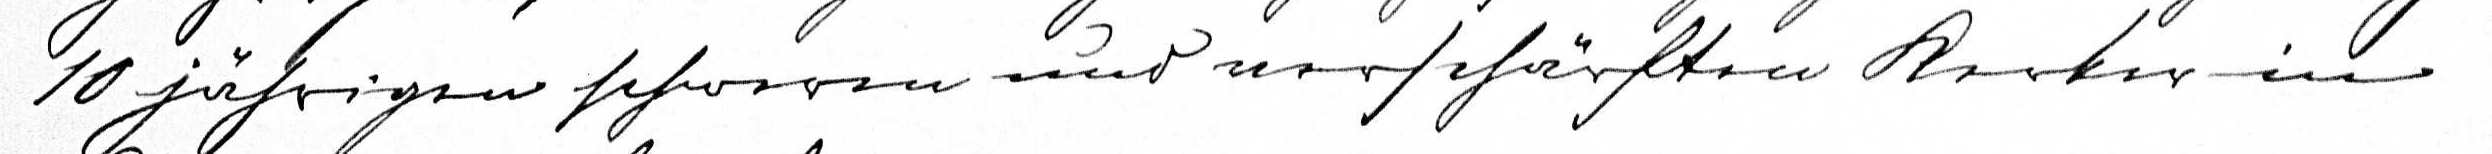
10jährigen schweren und verschärften Kerker in
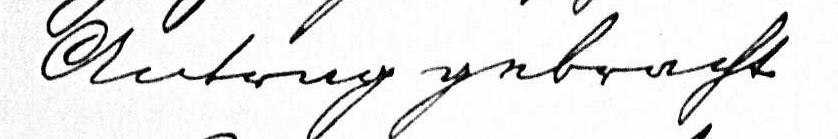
Antrag gebracht.
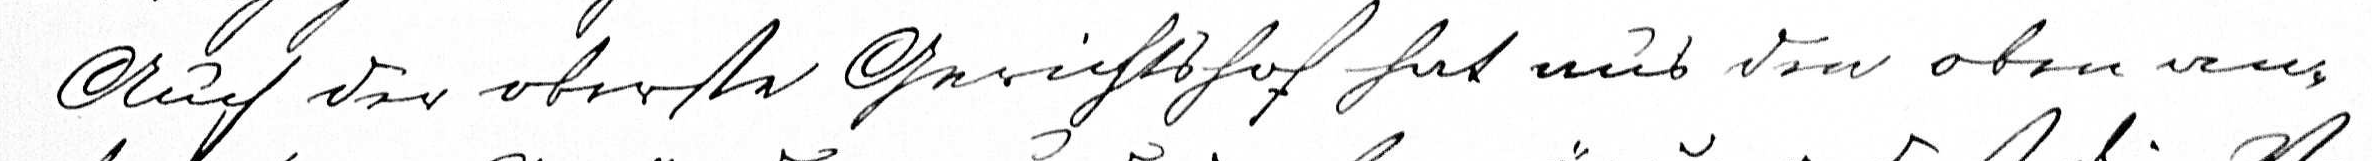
Auch der oberste Gerichtshof hat aus den oben an¬
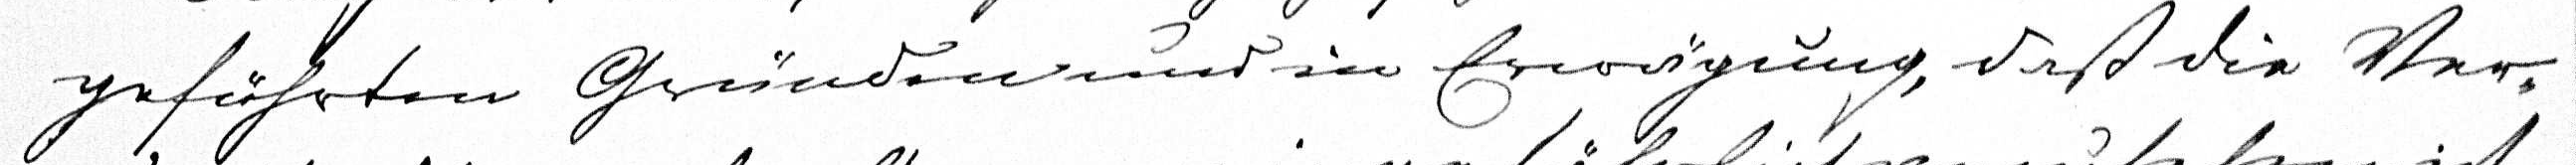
geführten Gründen und in Erwägung, daß die Ver¬
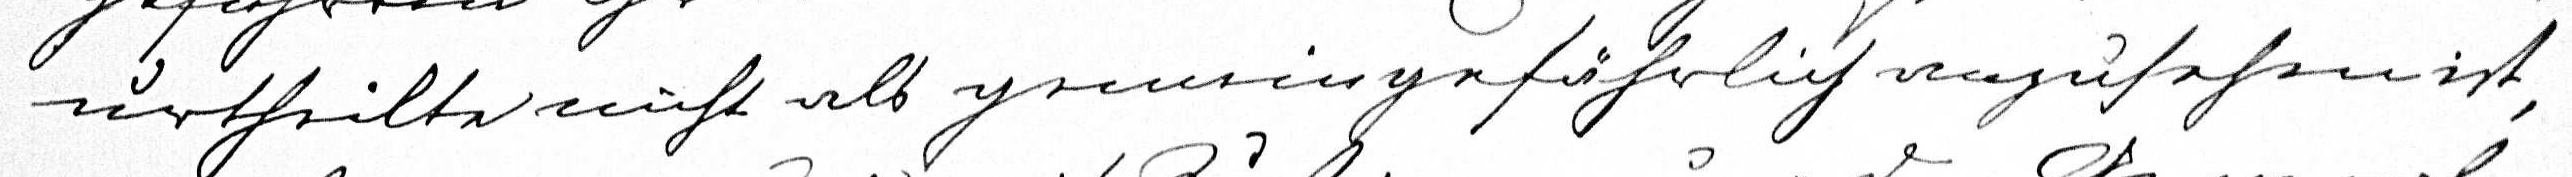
urtheilte nicht als gemeingefährlich anzusehen ist,
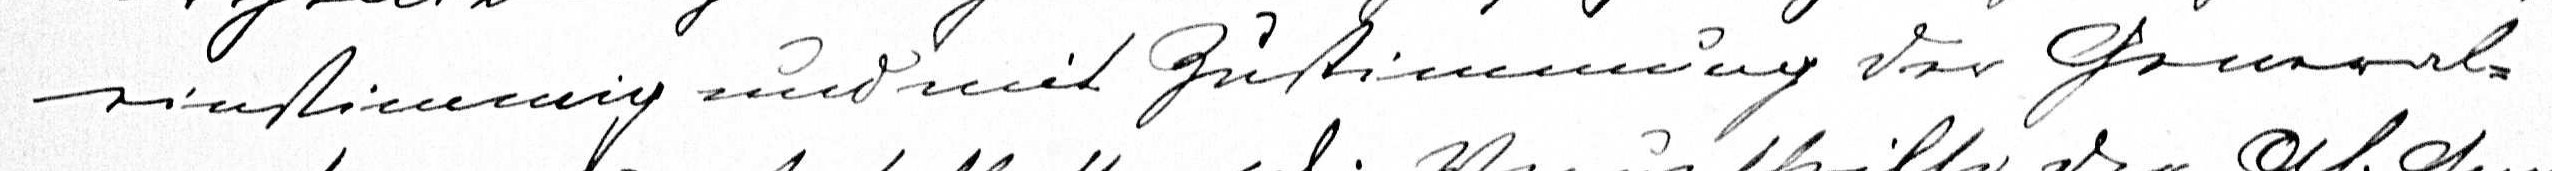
einstimmig und mit Zustimmung der General¬
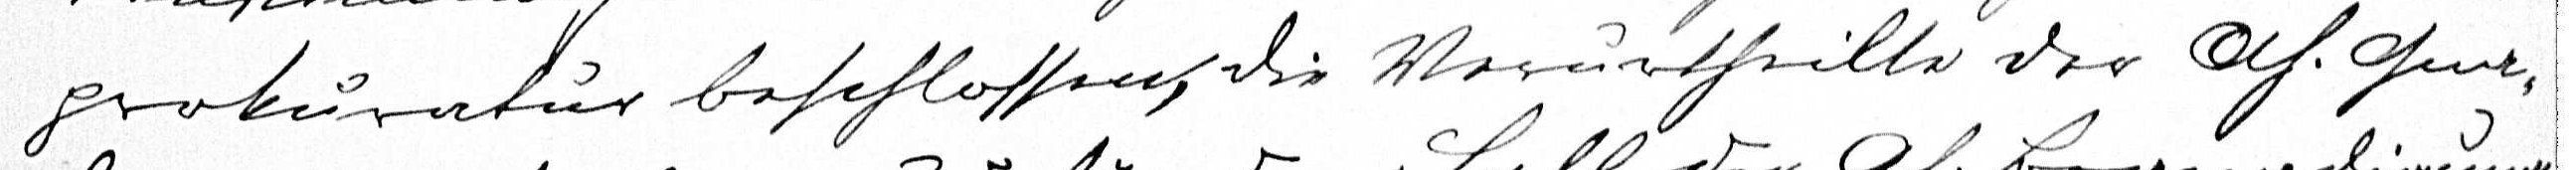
prokuratur beschlossen, die Verurtheilte der Ah. Gna¬
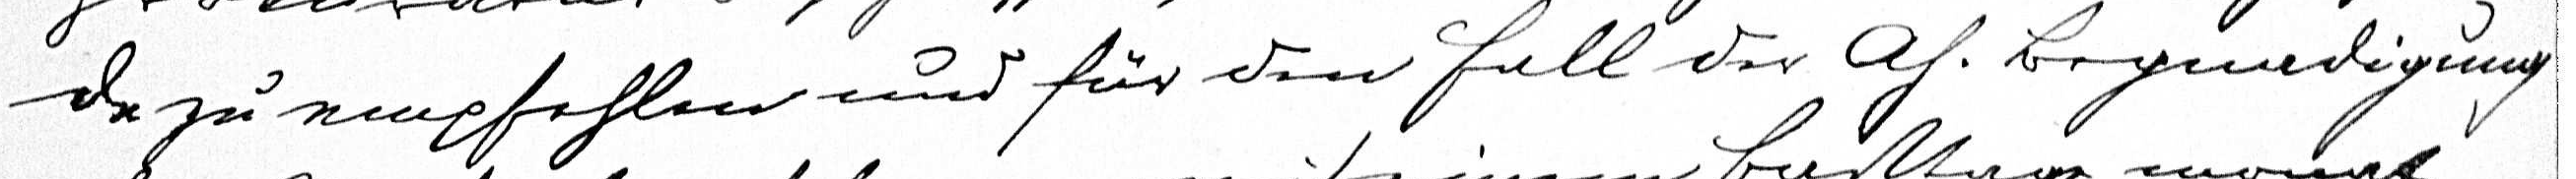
de zu empfehlen und für den Fall der Ah. Begnadigung
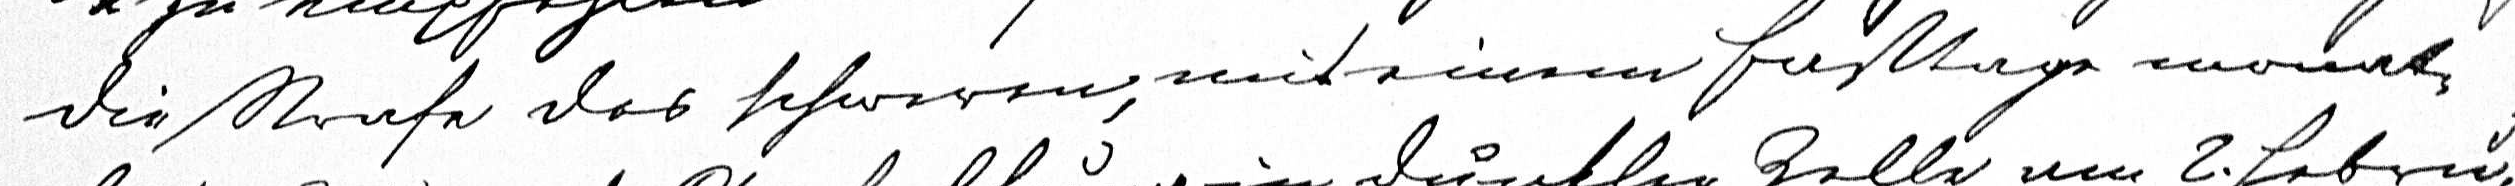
die Strafe des schweren, mit einem Fasttage monat¬
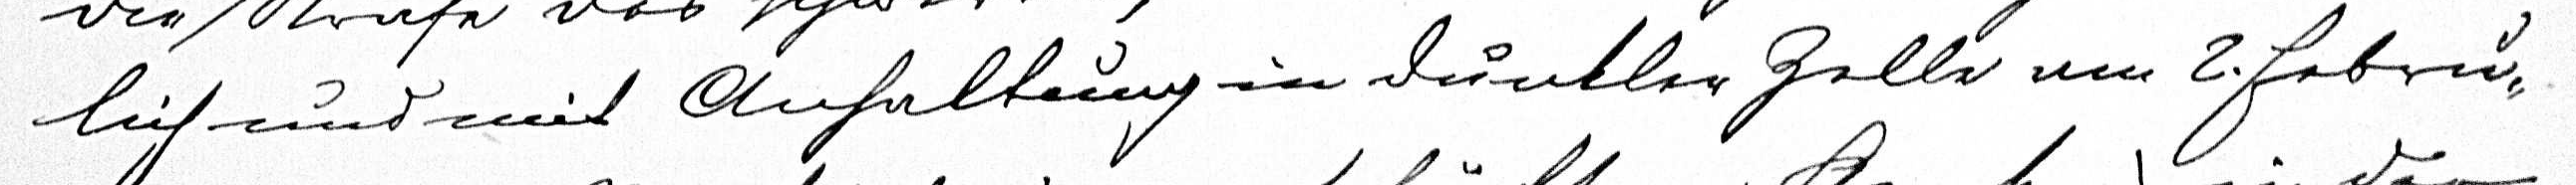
lich und mit Anhaltung in dunkler Zelle am 2. Febru¬
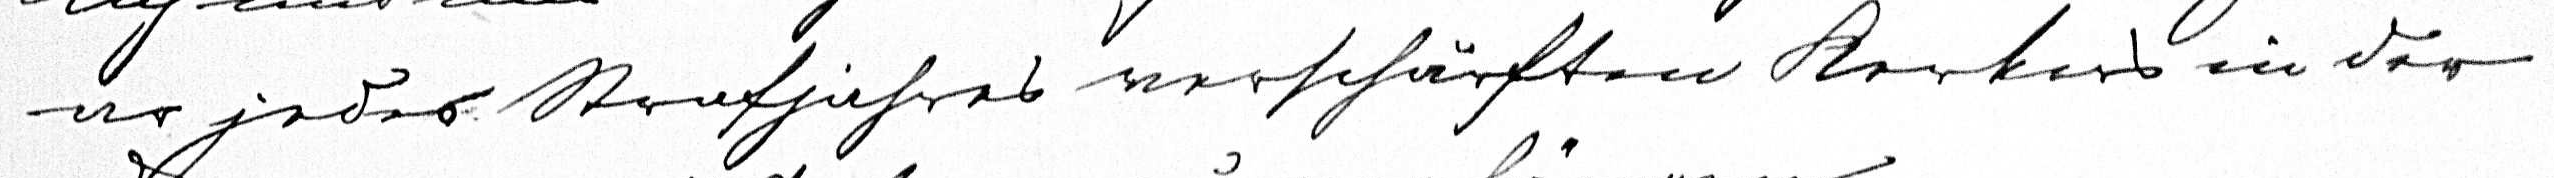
ar jedes Strafjahers verschärften Kerkers in der
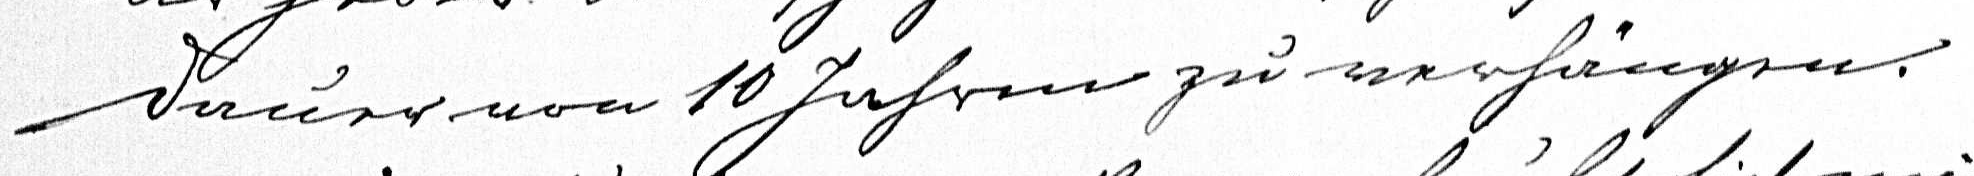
Dauer von 10 Jahren zu verhängen.
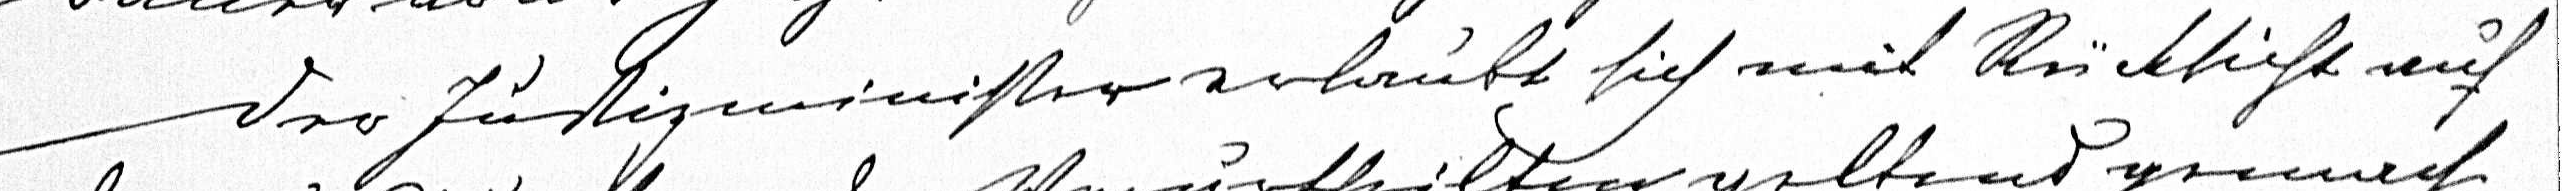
Der Justizminister erlaubt sich mit Rücksicht auf
